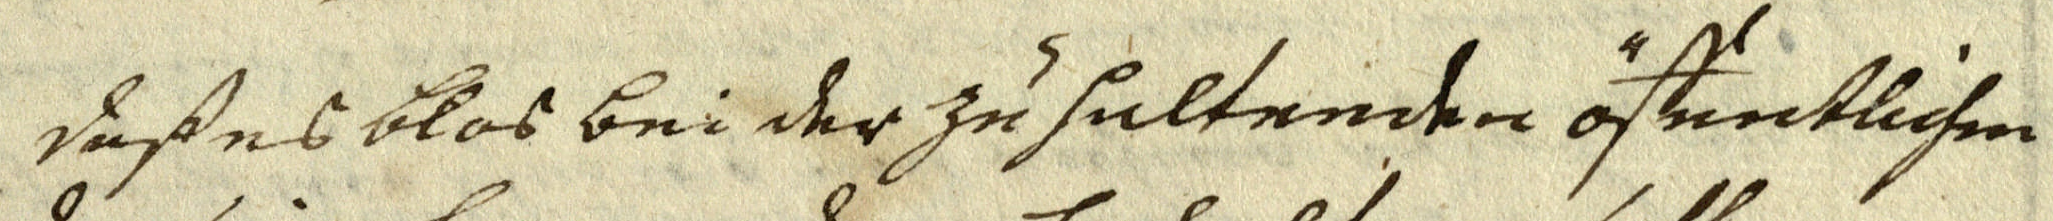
das es blos bei der zu haltenden öffentlichen
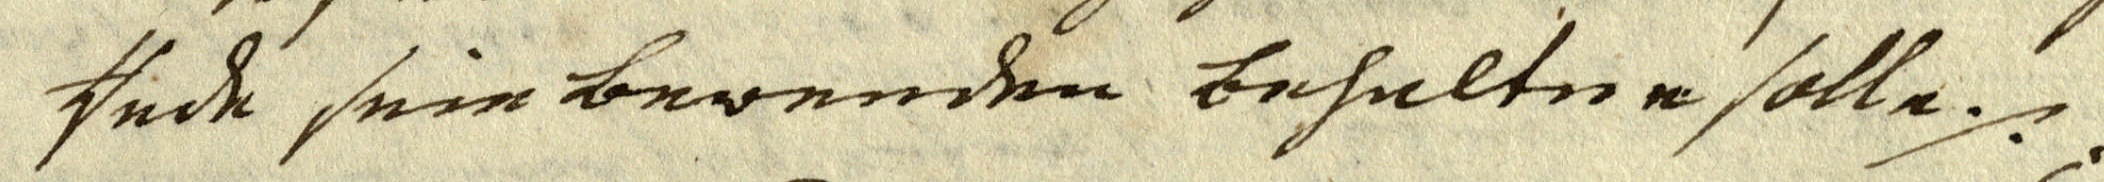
Rede sein Bewenden behalten solle.
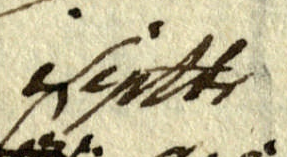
Septbr.
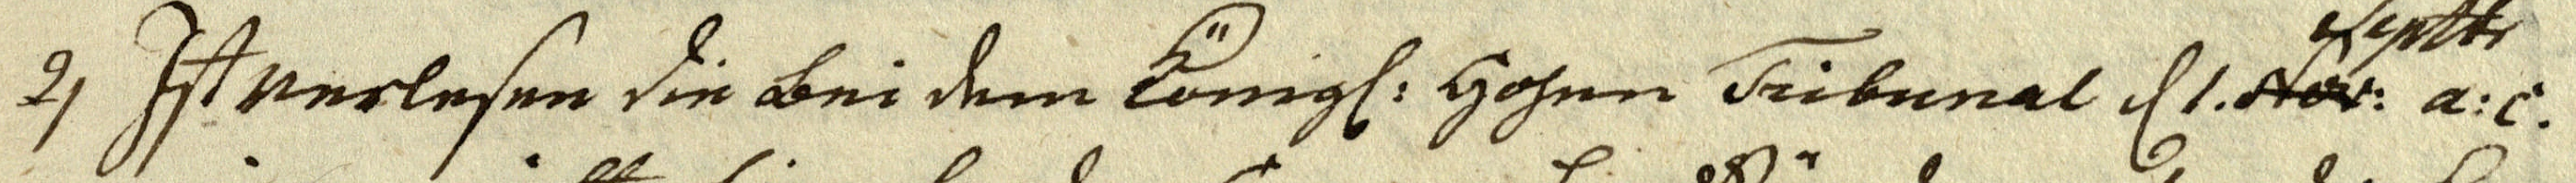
2, Ist verlesen die bei dem Königl. Hohen Tribunal C 1. Nov. a. c.
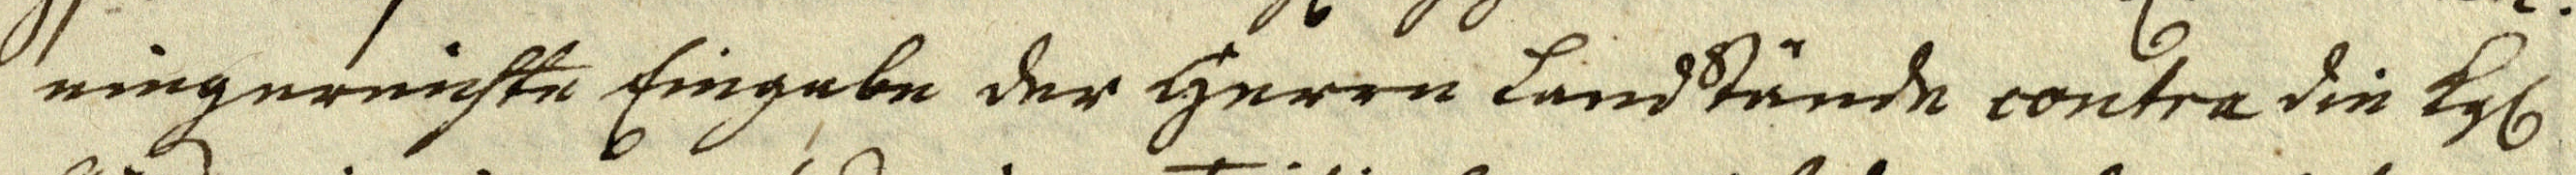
eingereichte Eingabe der Herren LandStände contra die Kgl.
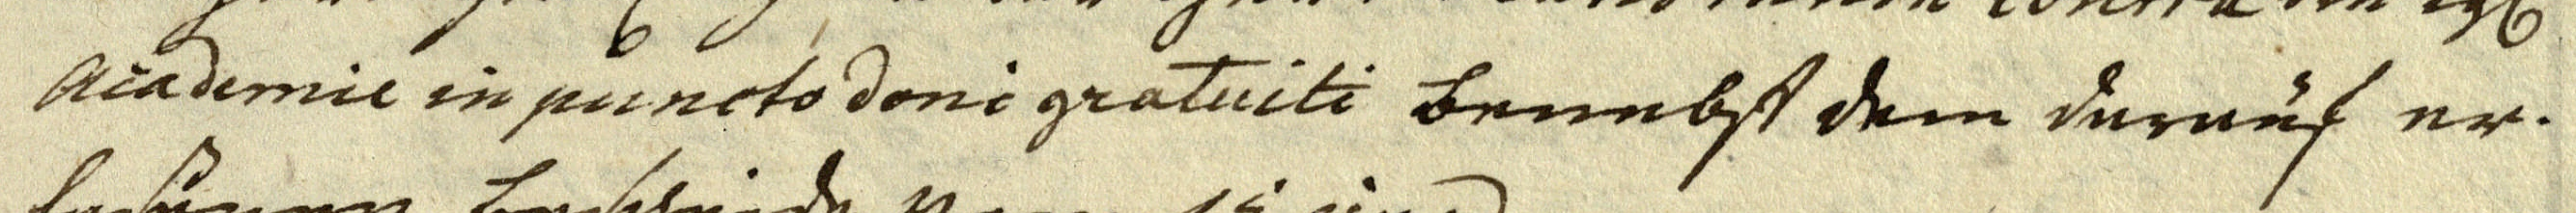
Academie in puncto doni gratuiti benebst dem darauf er¬
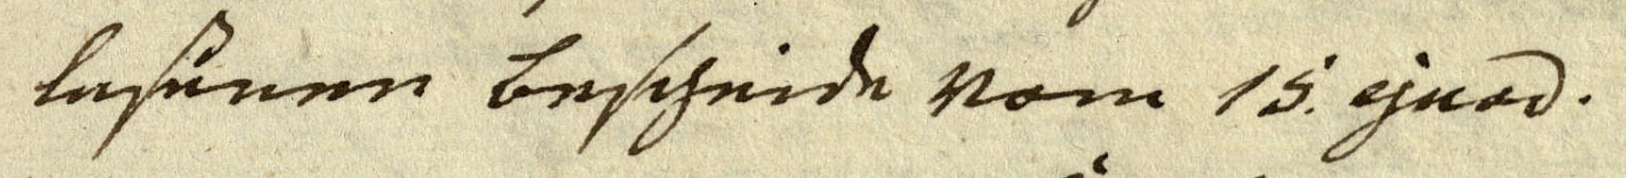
laßenen Bescheide vom 15. ejusd.
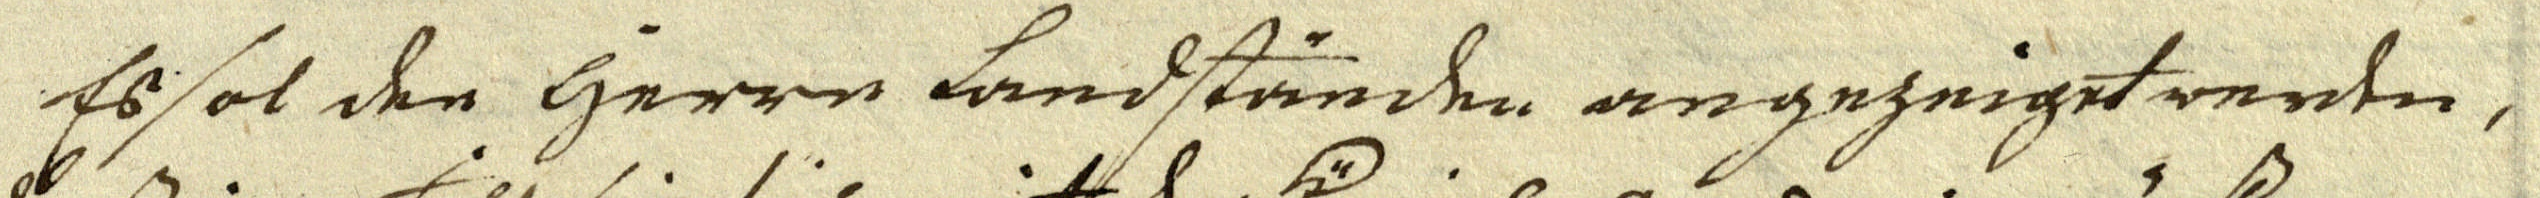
Es soll den Herren Landständen angezeiget werden,
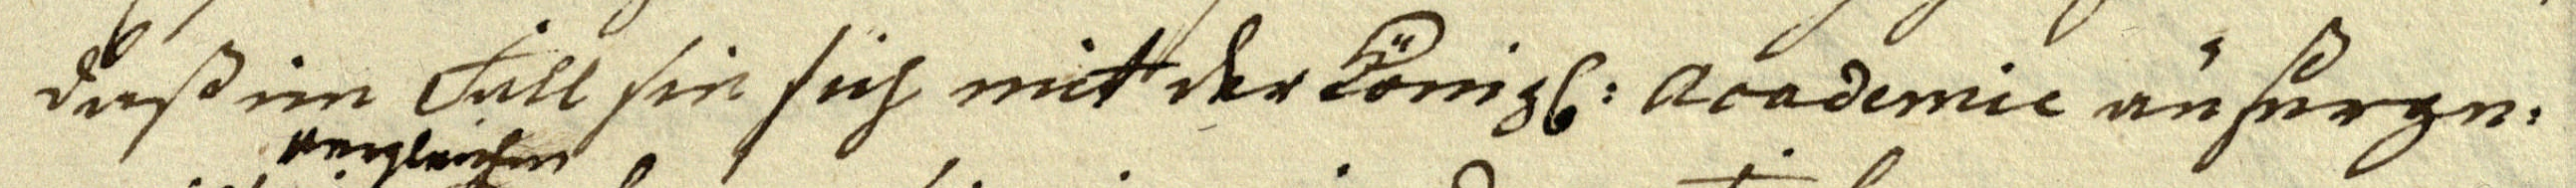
daß im Fall sie sich mit der Königl. Academie außerge¬
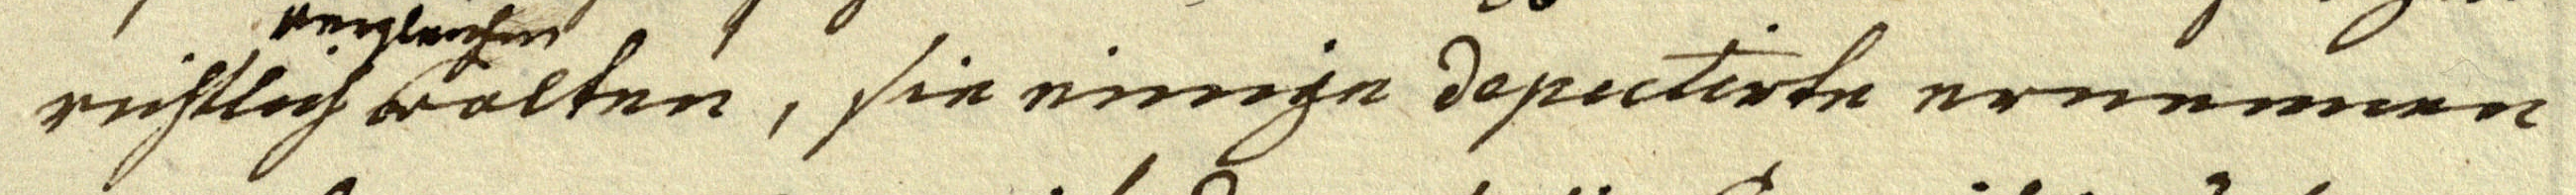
richtlich vergleichen wolten, sie einige deputirte ernennen
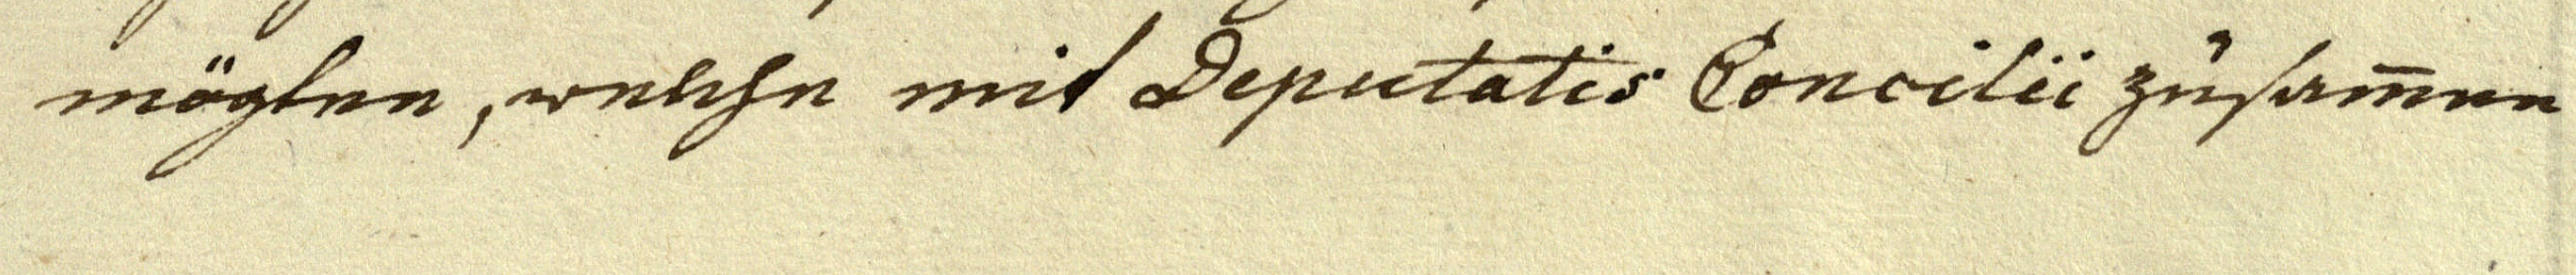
mögten, welche mit Deputatis Concilii zusamen
